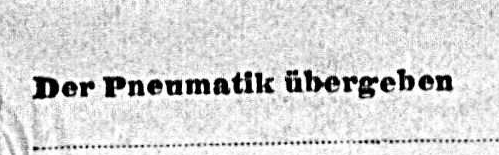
Der Pneumatik übergeben
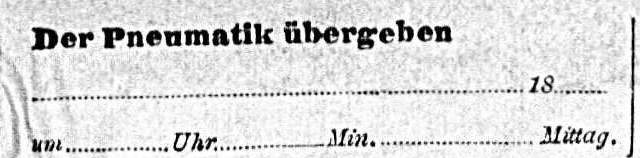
.. 18 ...
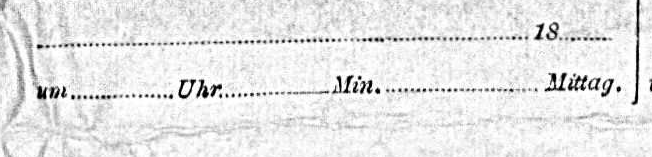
um ... Uhr ... Min. ... Mittag.
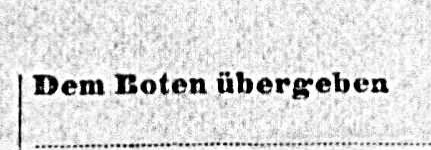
Der Boten übergeben
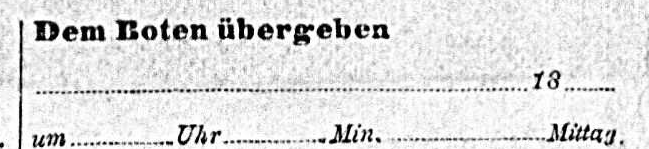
.. 18 ...
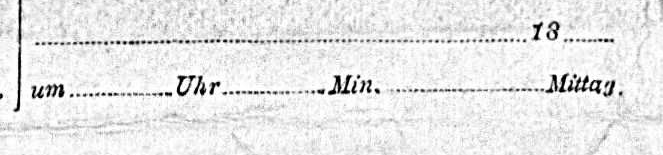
um ... Uhr ... Min. ... Mittag.
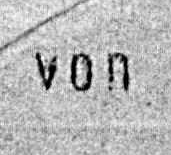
von
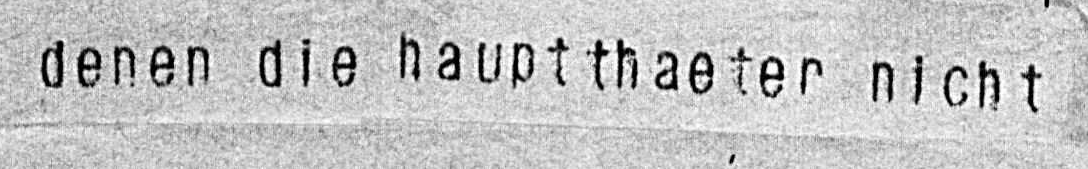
denen die hauptthaeter nicht
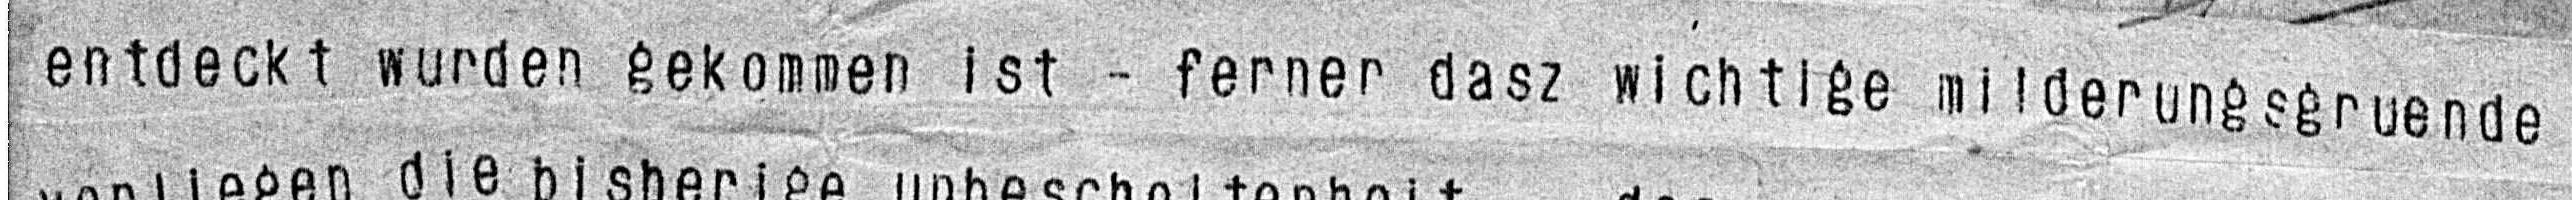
entdeckt wurden gekommen ist - ferner dasz wichtige milderungsgruende
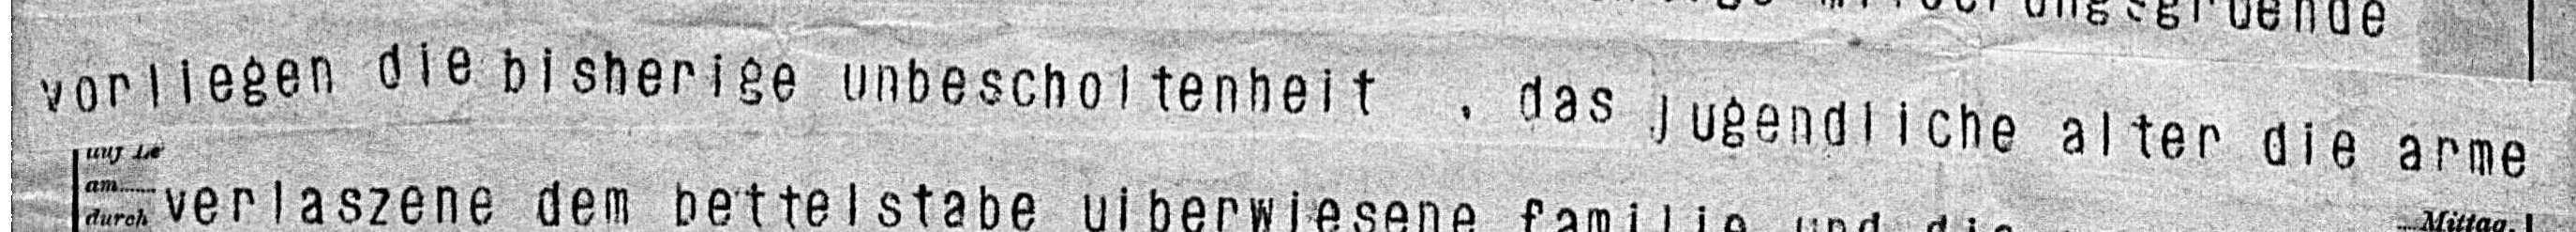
vorliegen die bisherige unbescholtenheit, das jugendliche alter die arme
